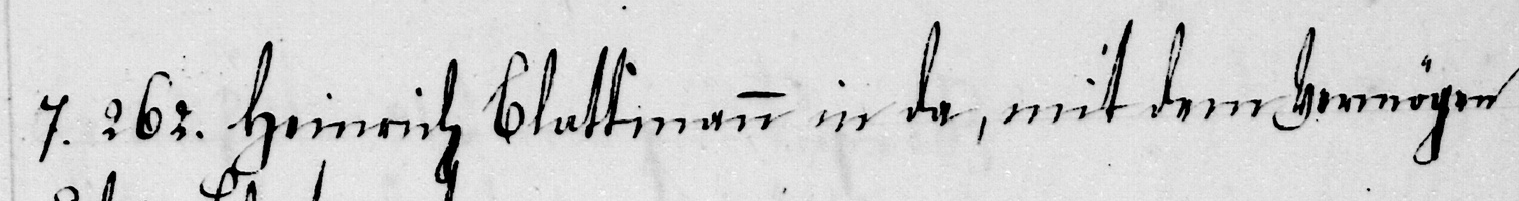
7. 262. Heinrich Blattmann in da, mit dem Vermögen
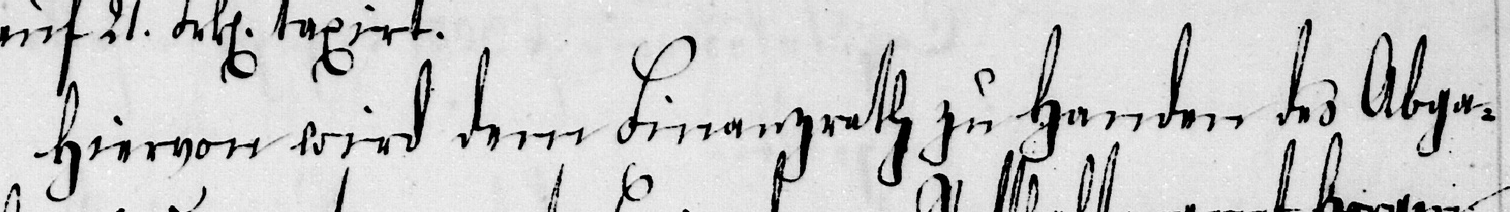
Hiervon wird dem Finanzrath zu Handen des Abga¬
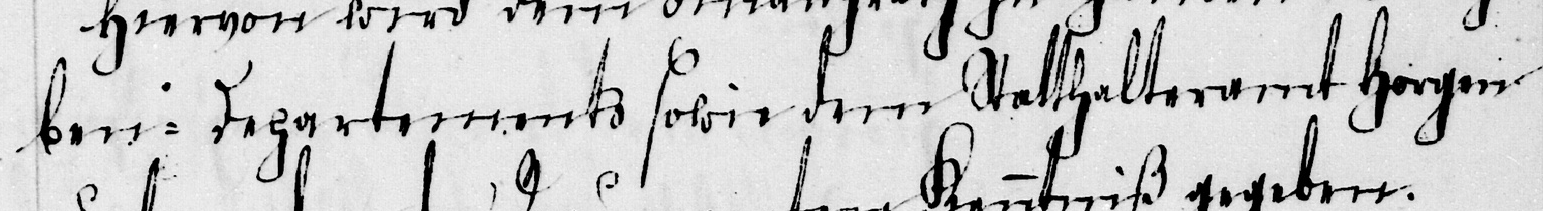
ben-Departements sowie dem Statthalteramt Horgen
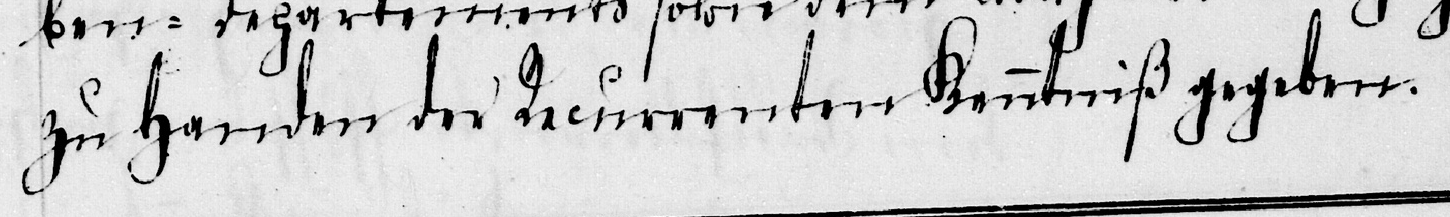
zu Handen der Recurrenten Kenntniß gegeben.
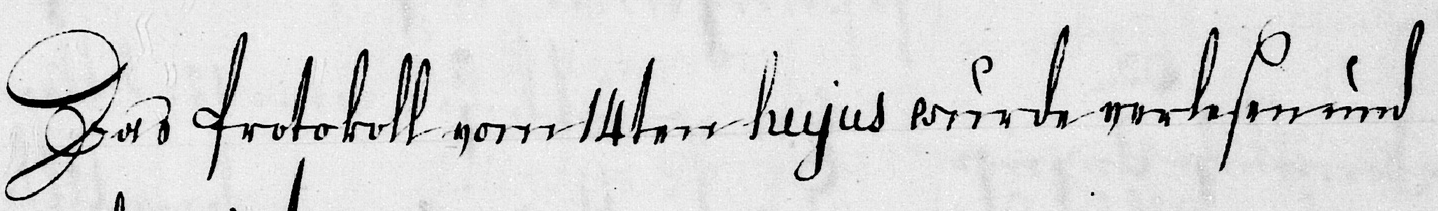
Das Protokoll vom 14ten hujus wurde verlesen und
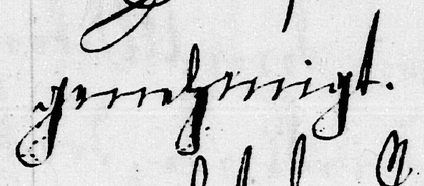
genehmigt.
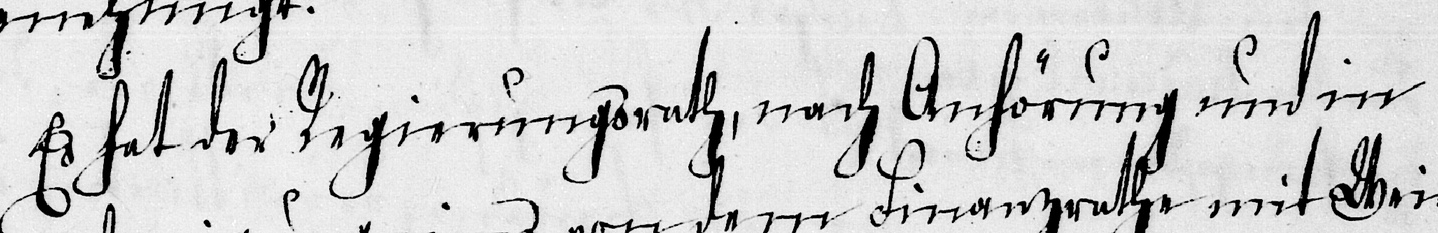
Es hat der Regierungsrath, nach Anhörung und in
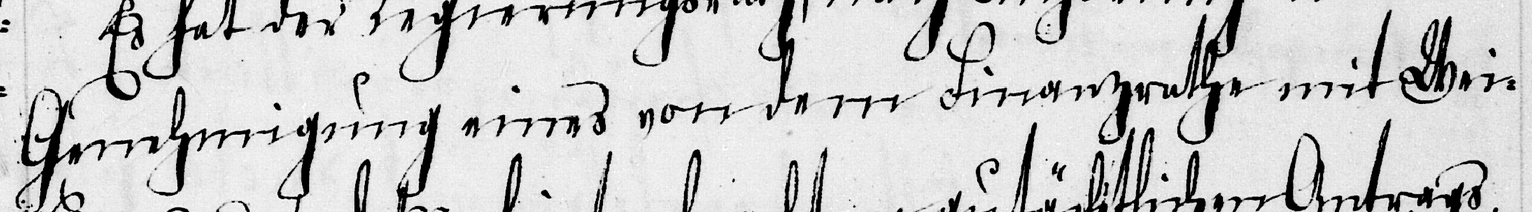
Genehmigung eines von dem Finanzrathe mit Wei¬
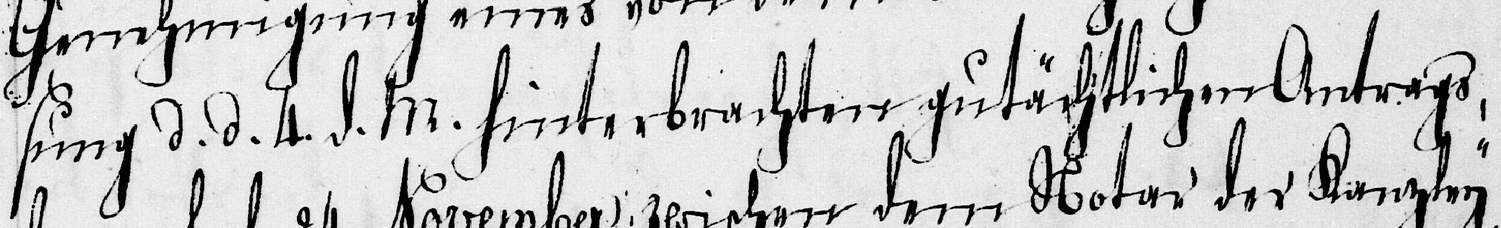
sung d. d. 4. d. M. hinterbrachten gutächtlichen Antrags,
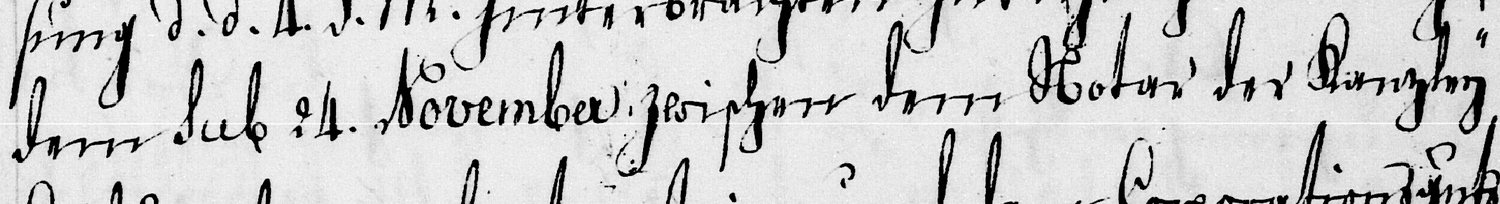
dem sub 24. November zwischen dem Notar der Kanzley
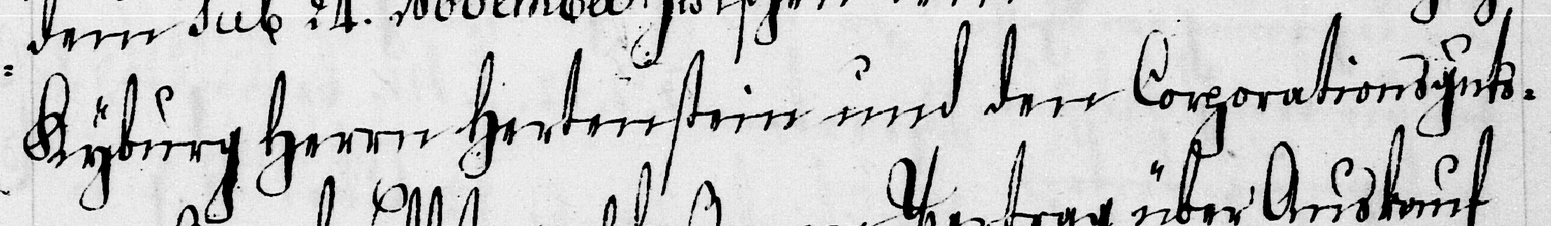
Kyburg Herrn Hertenstein und den Corporationsguts¬
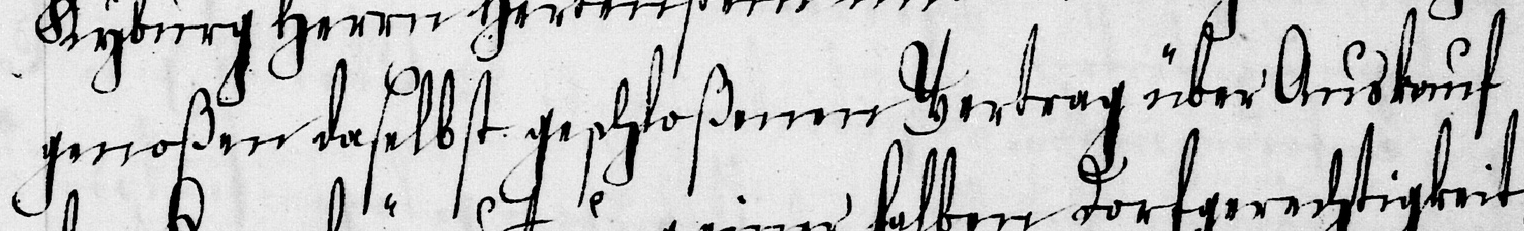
genoßen daselbst geschloßenen Vertrag über Auskauf
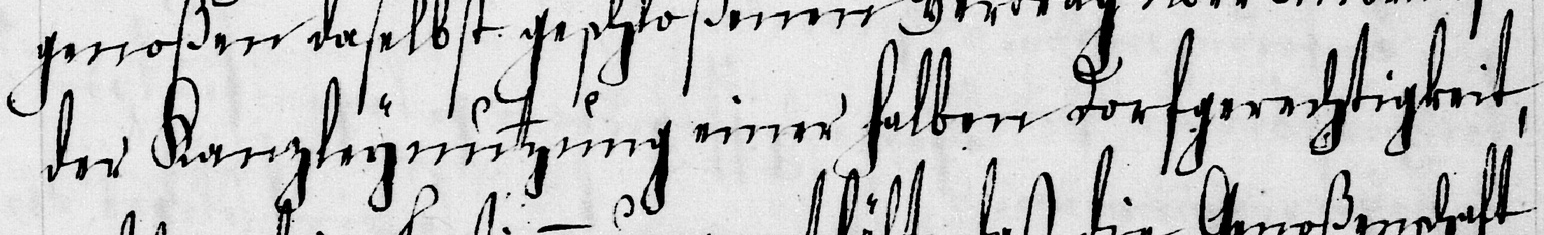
der Kanzleynutzung einer halben Dorfgerechtigkeit,
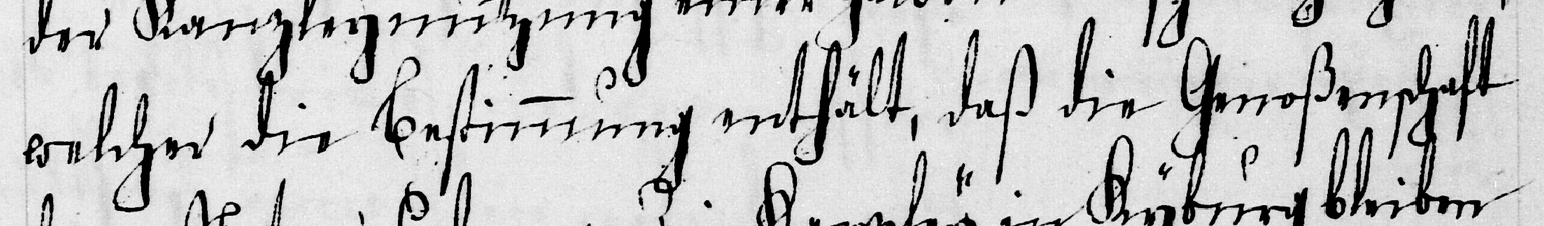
welcher die Bestimmung enhält, daß die Genoßenschaft
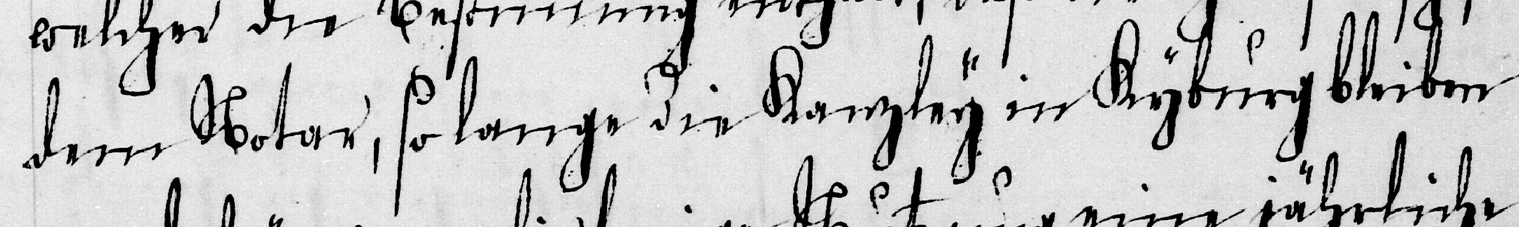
dem Notar, so lange die Kanzley in Kyburg bleiben
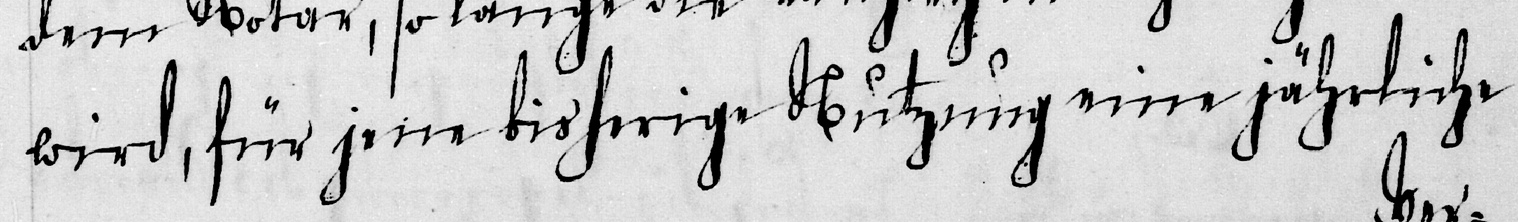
wird, für jede bisherige Nutzung eine jährliche
